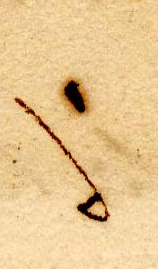To
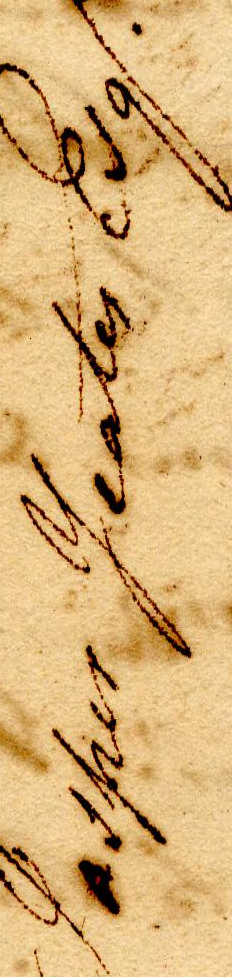Jasper Yeates Esq^r.
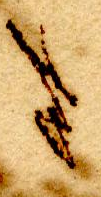at
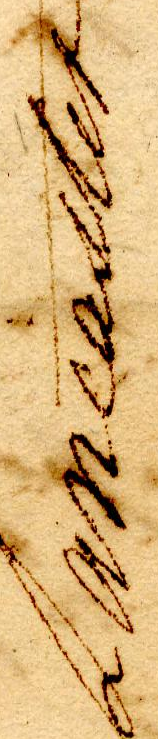Lancaster
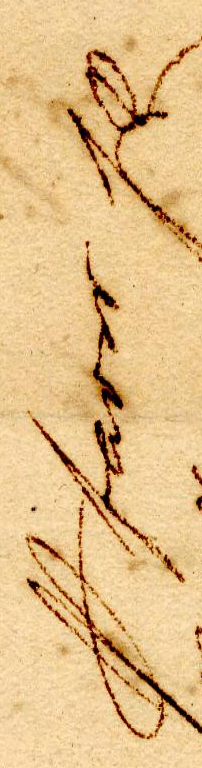per favor of
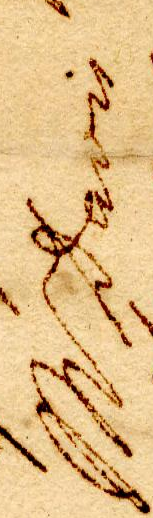M^r Davis
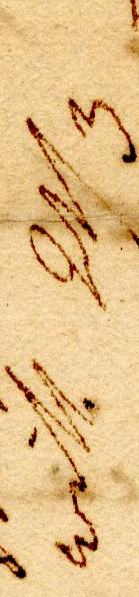with 21s3
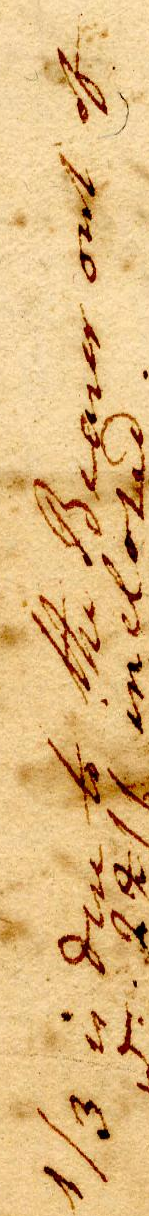1/3 is due to the Bearer out of
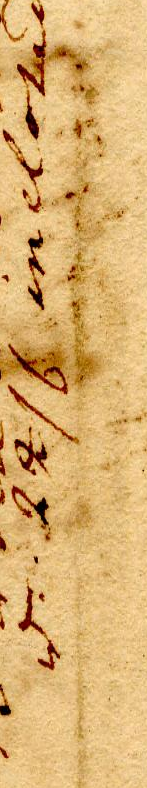y^e. 22s6 inclosed
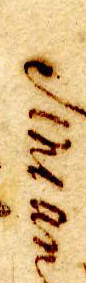Tinian
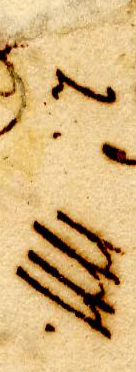2^d. 1777.
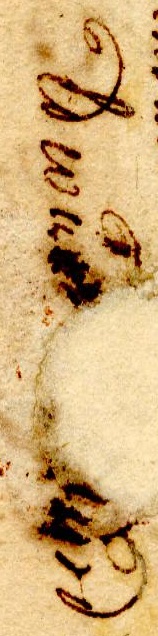Edward Burd
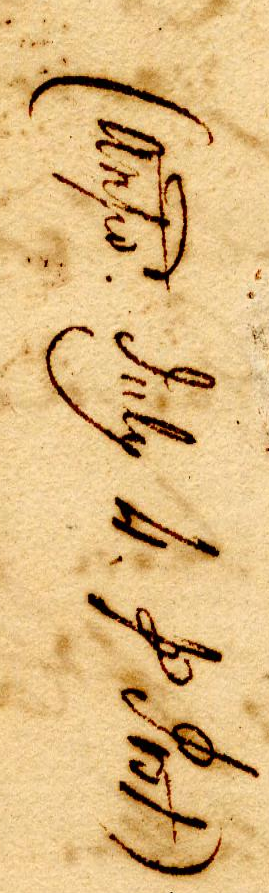(Answ^d July 4. per Post)
